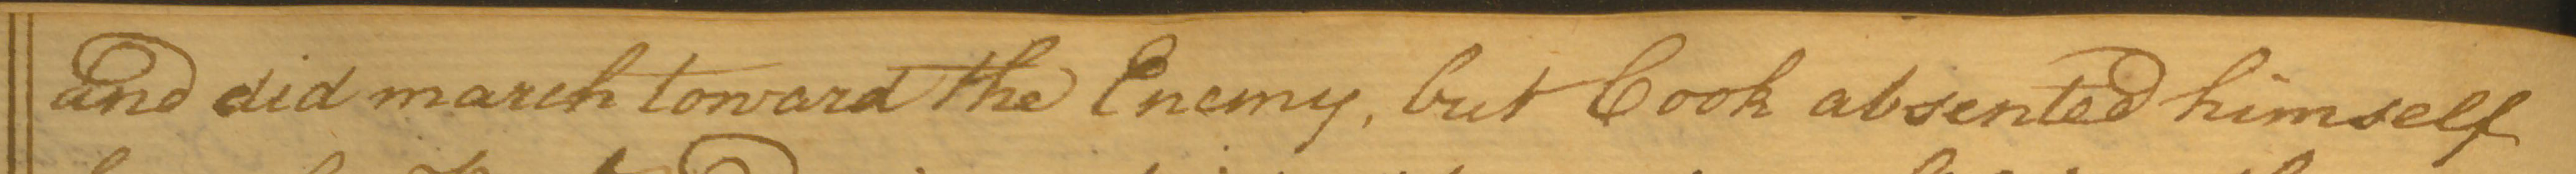and did not march toward the Enemy, but Cook absented himself
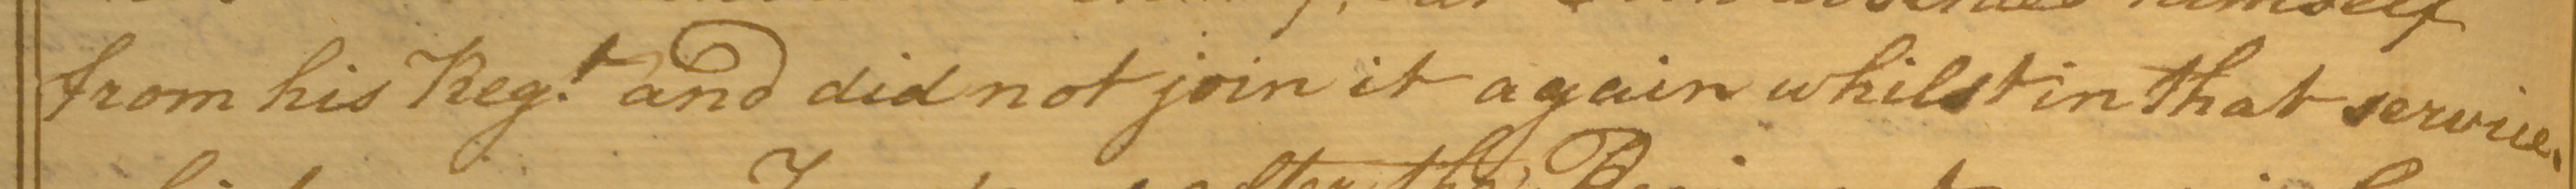from his Reg^t. and did not join it again whilst in that service,
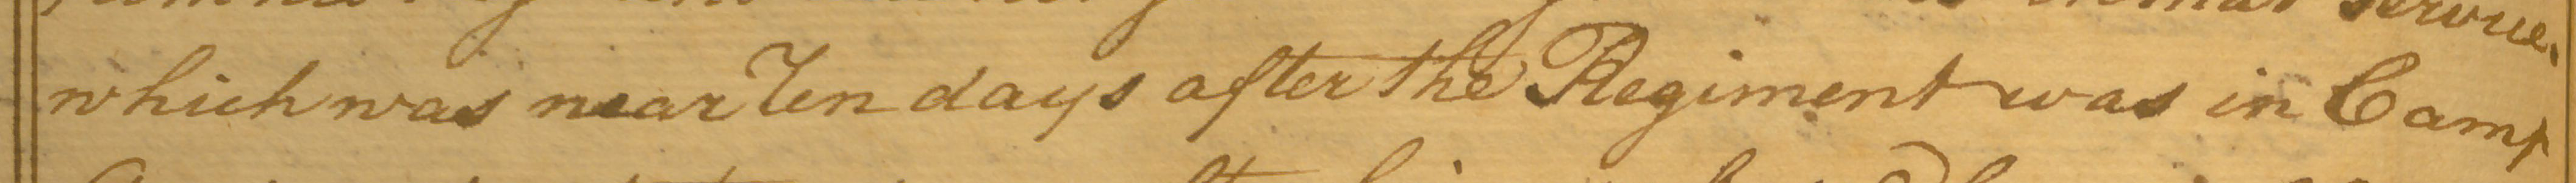which was near Ten days after the Regiment was in Camp
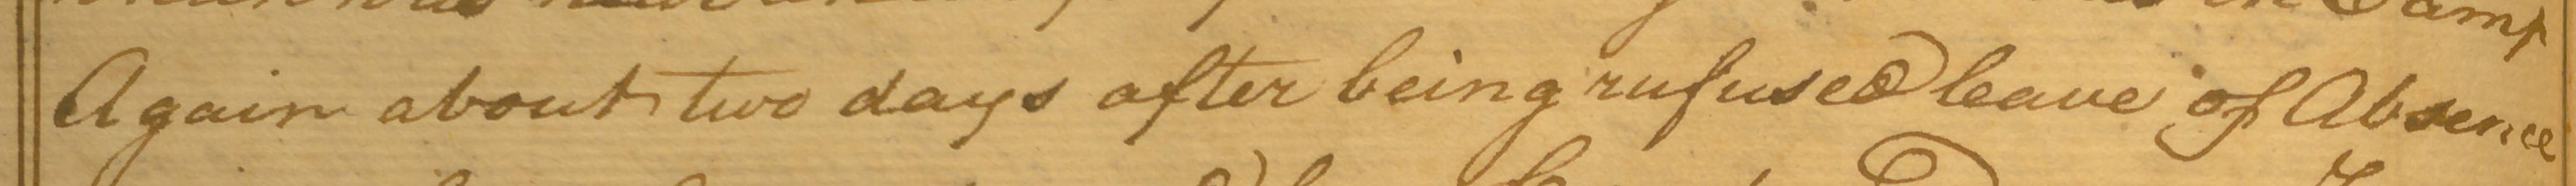Again about two days after being refused leave of Absence
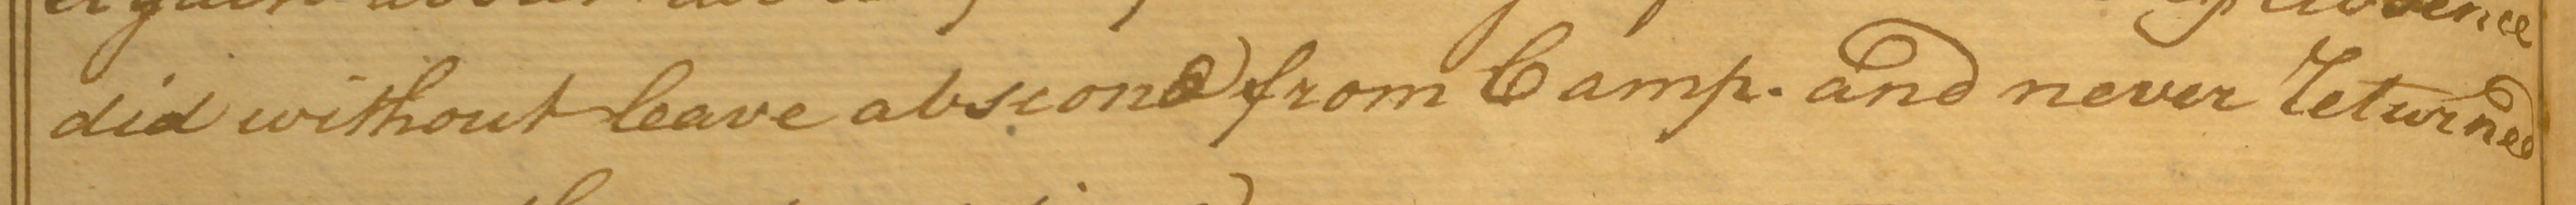did without leave abscond from Camp. and never returned
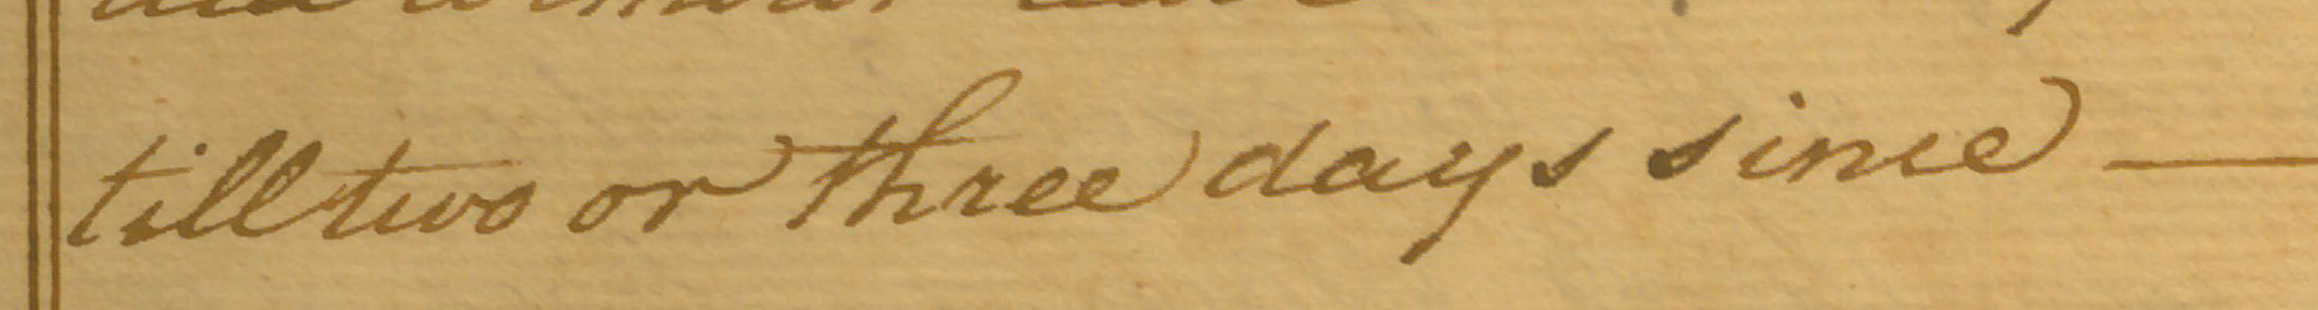till two or three days since-
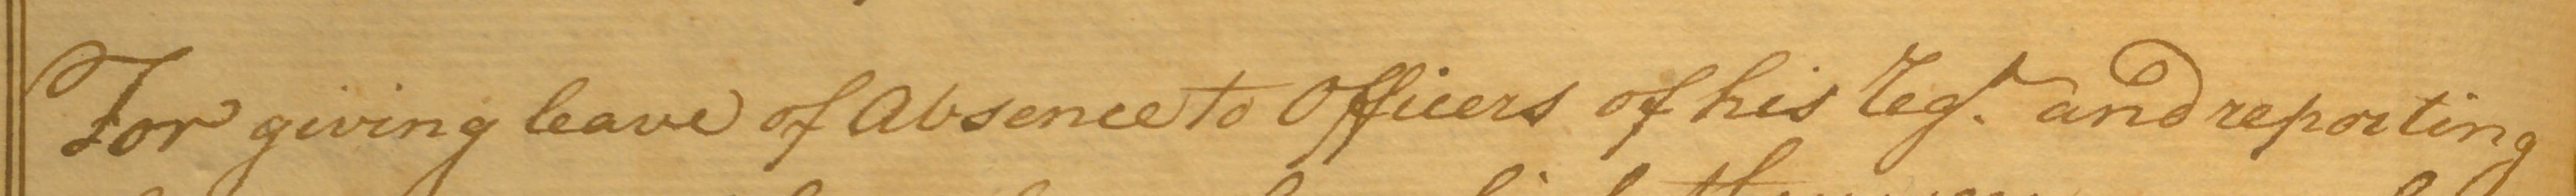For giving leave of Absence to Officers of his reg^t. and reporting
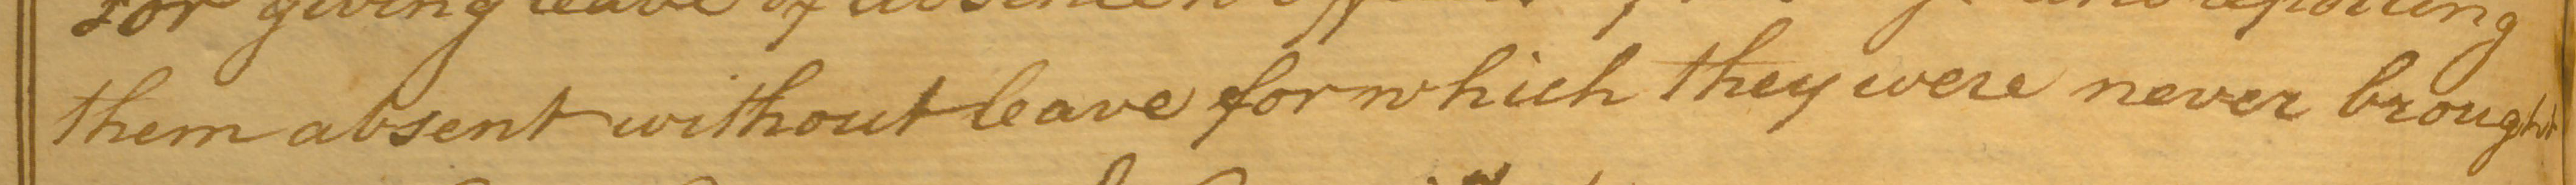them absent without leave for which they were never brought
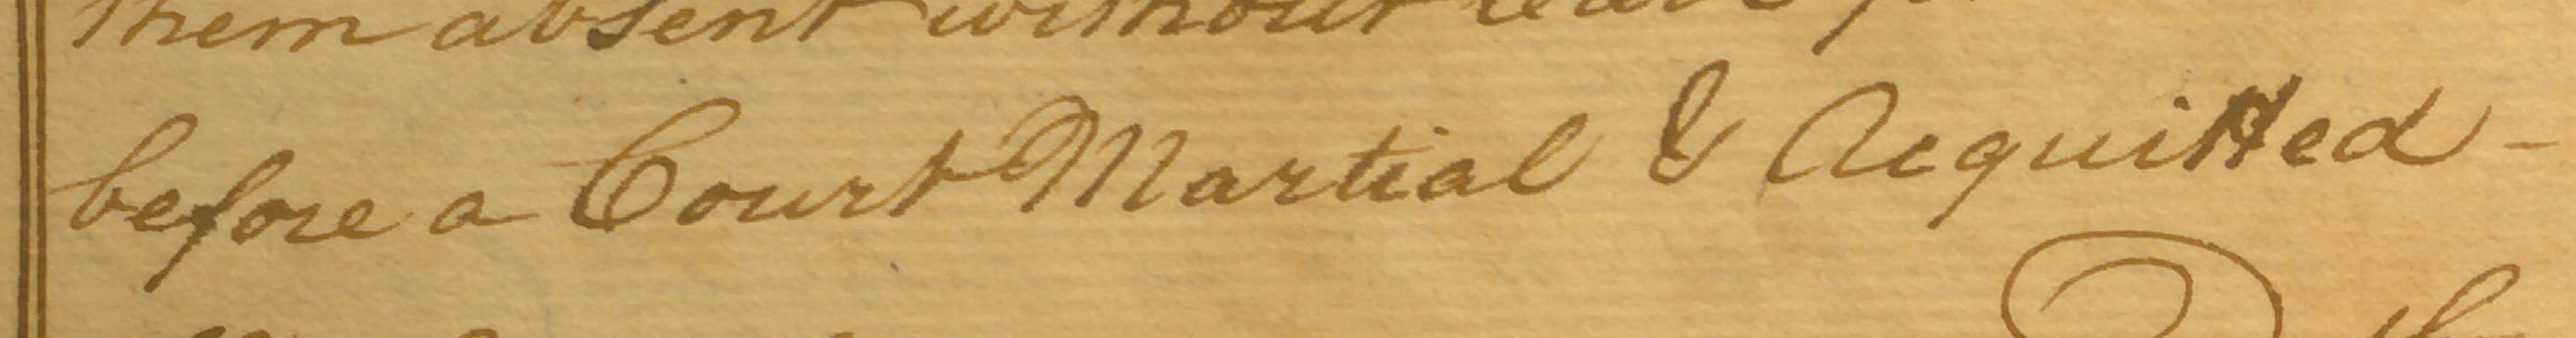before a Court Martial & Acquitted-
